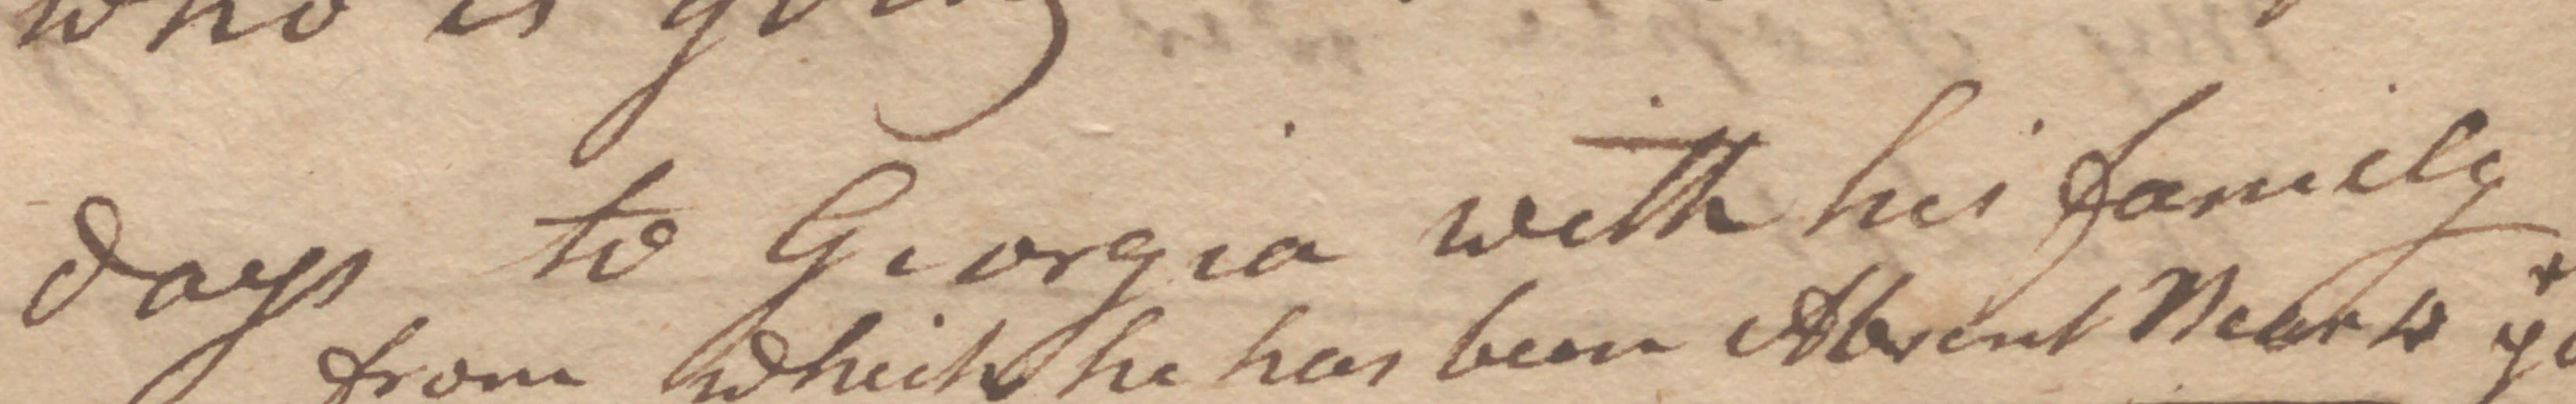days to Georgia with his family
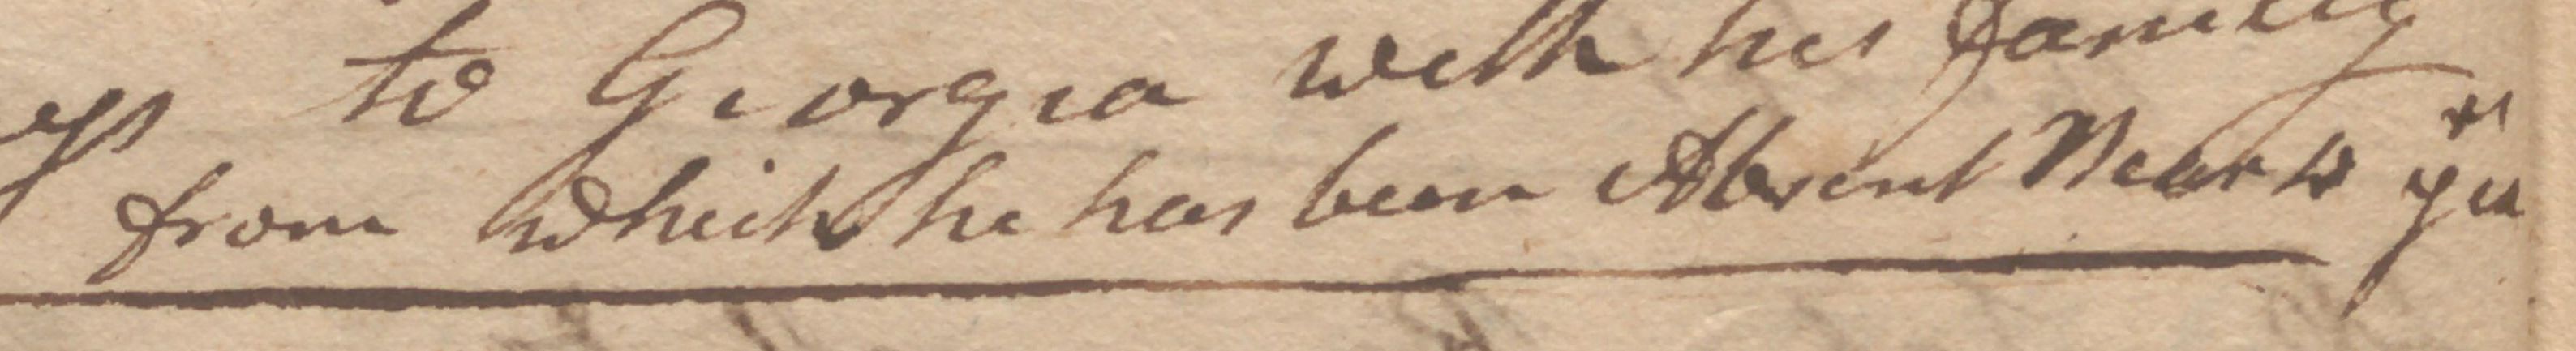from which he has been Absent Near 4 yea^rs
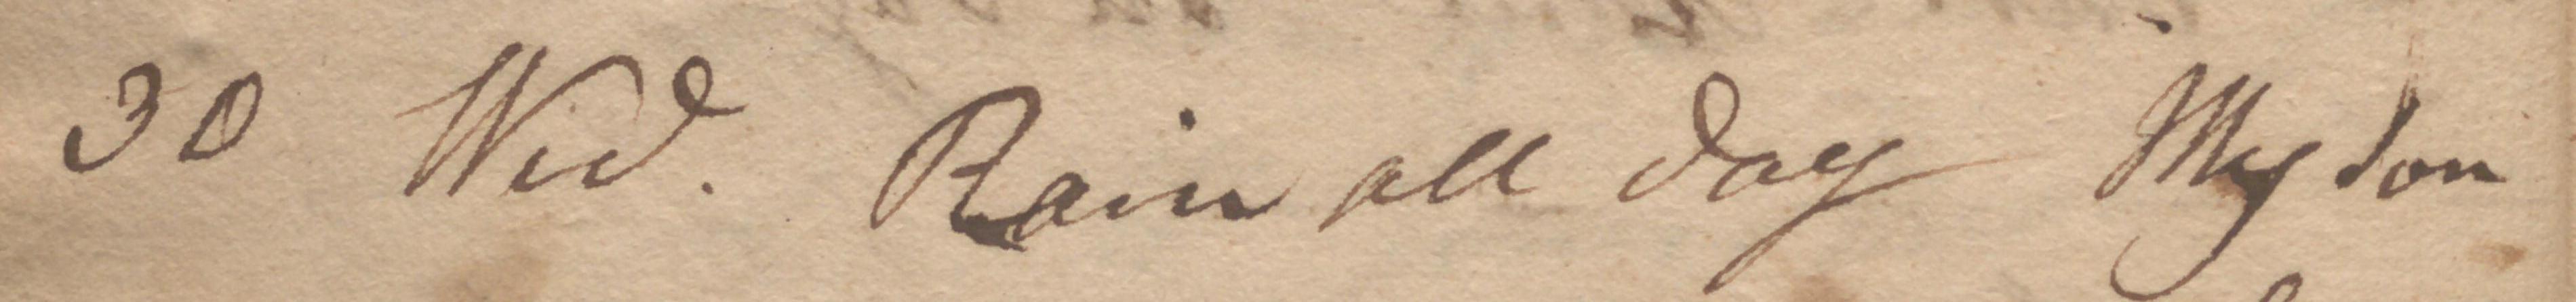30 Wed. Rain all day, My son
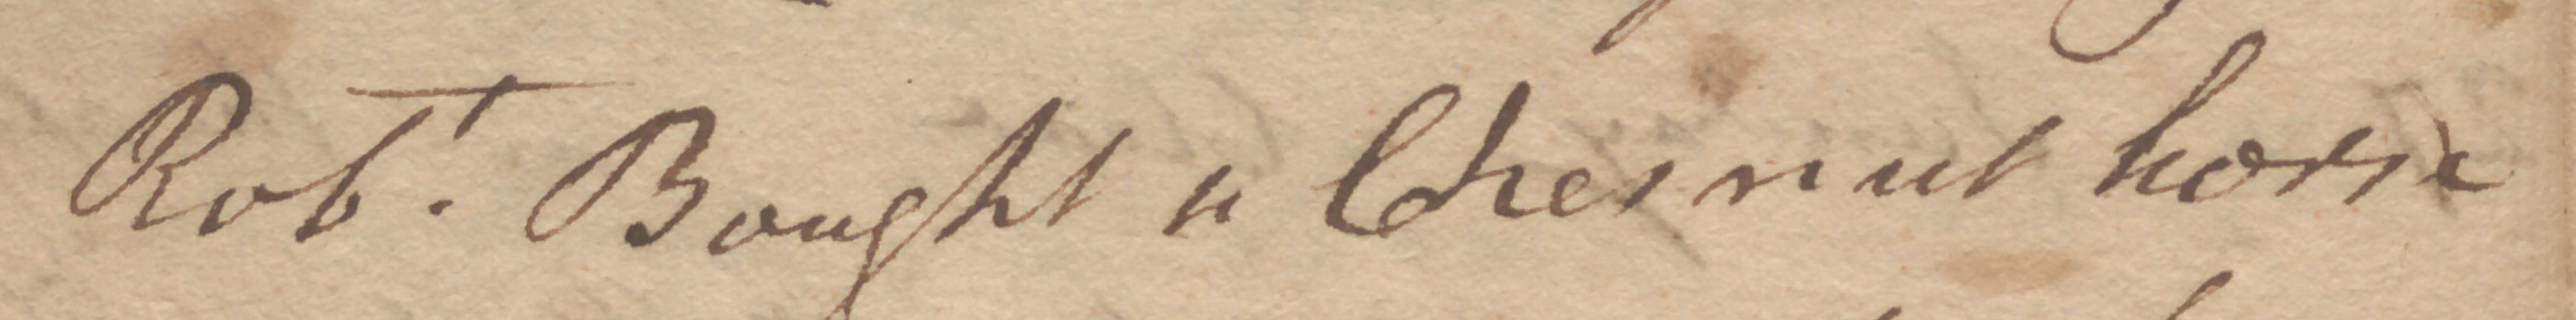Rob^t. Bought a Chesnut horse
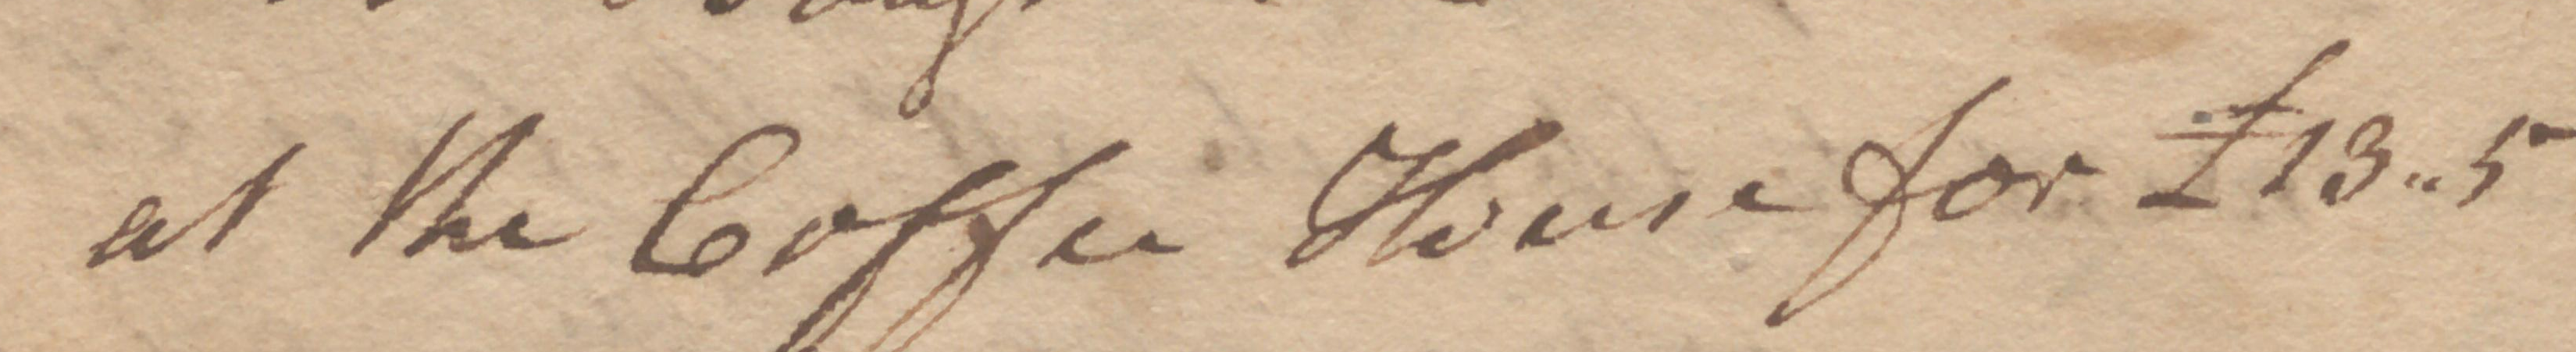at the Coffee House for £13.5
